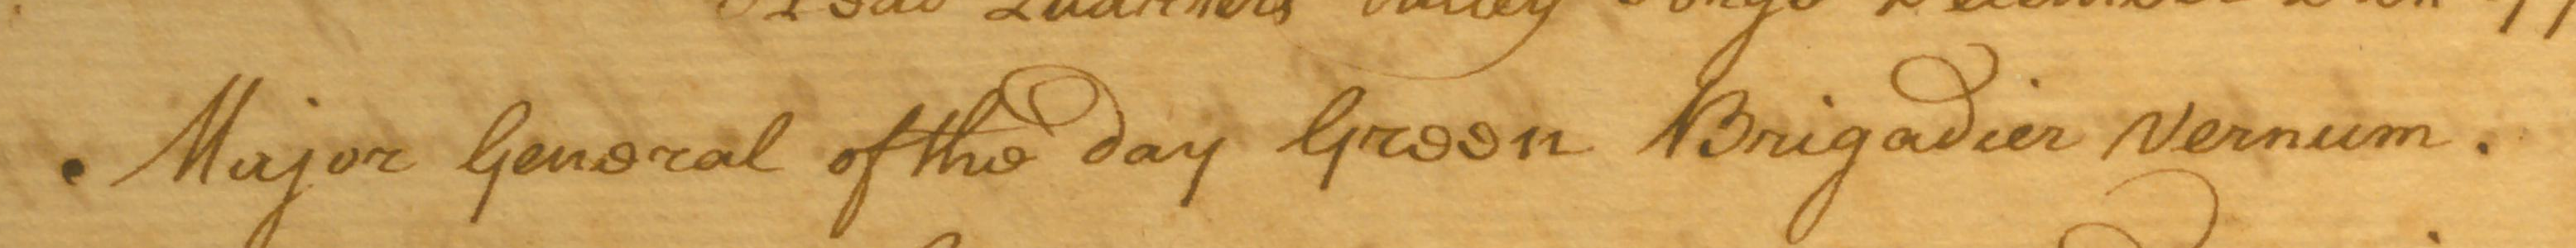Major General of the day Green Brigadier Vernum.
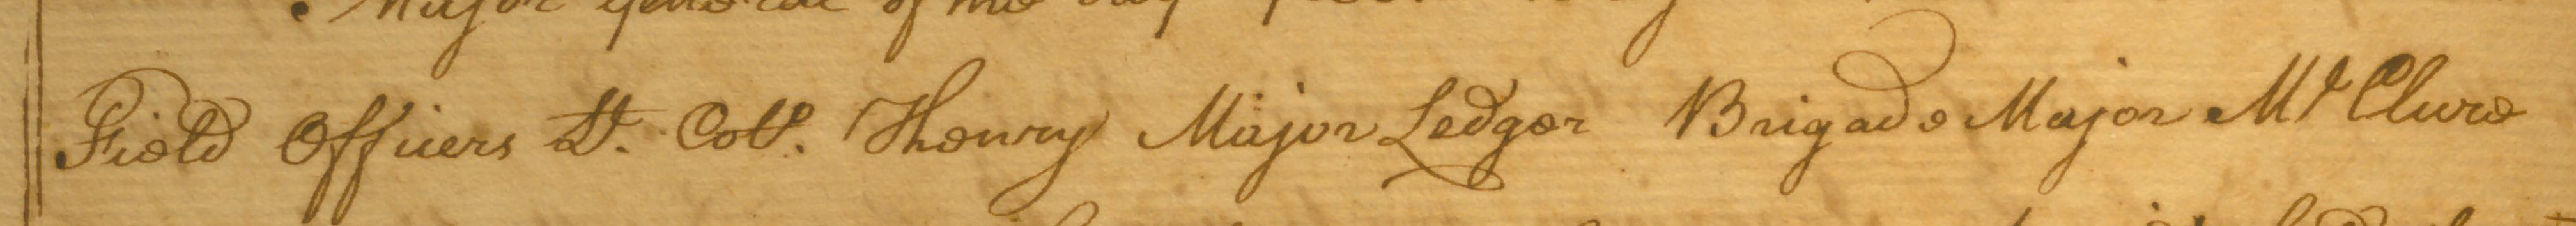Field Officers L^t. Col^o. Henry Major Ledger Brigade Major M^cClure
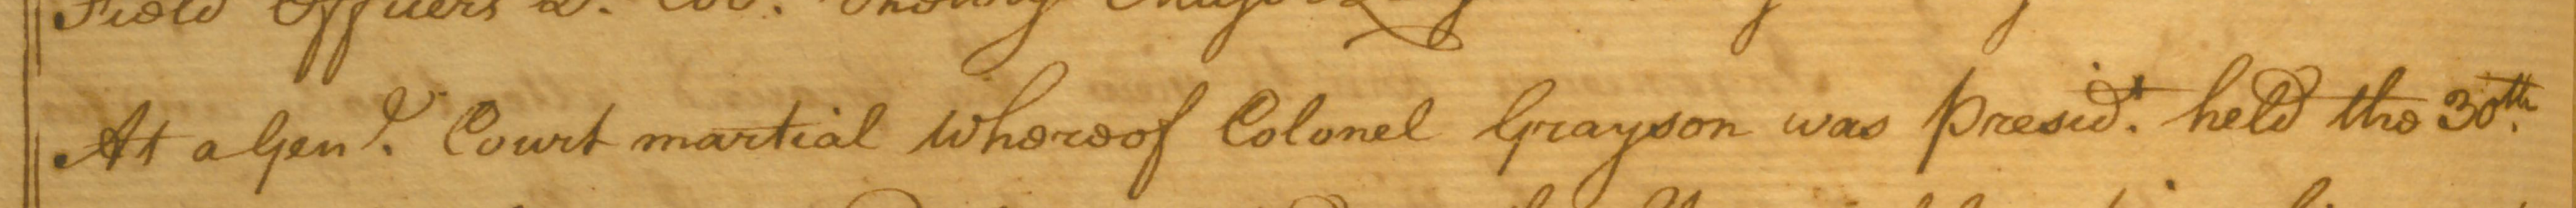At a Gen^l. Court martial whereof Colonel Grayson was Presid^t. held the 30^th.
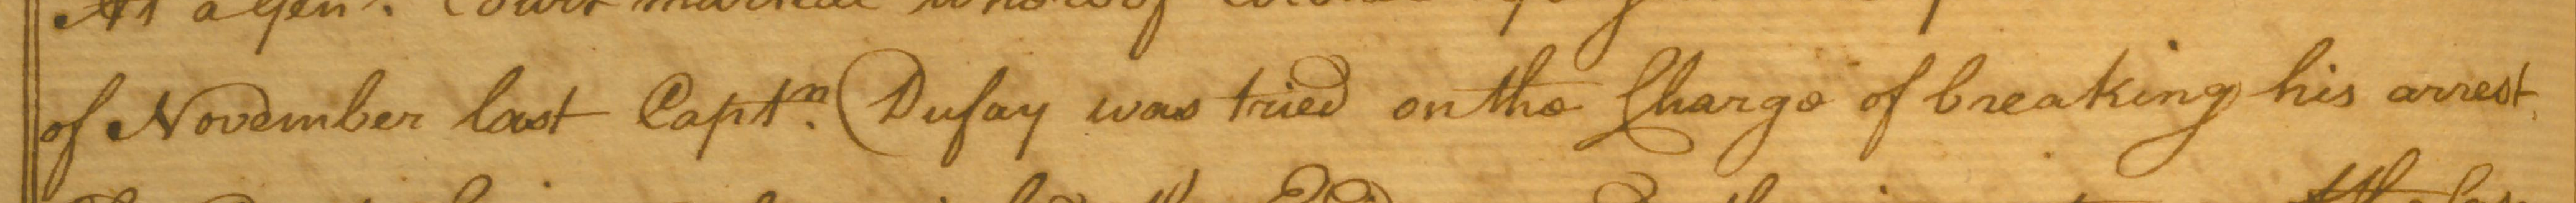of November last Capt^n. Dufay was tried on the Charge of breaking his arrest.
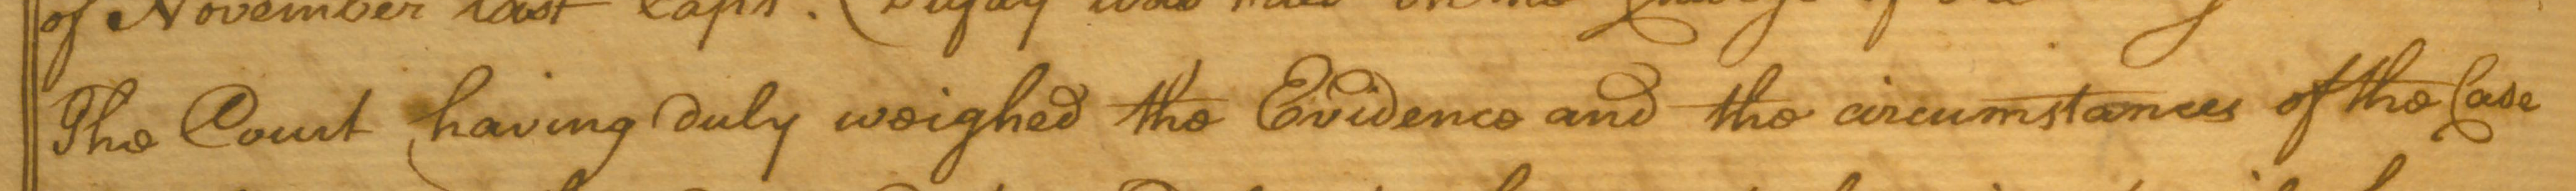The Court having duly weighed the Evidence and the circumstances of the Case
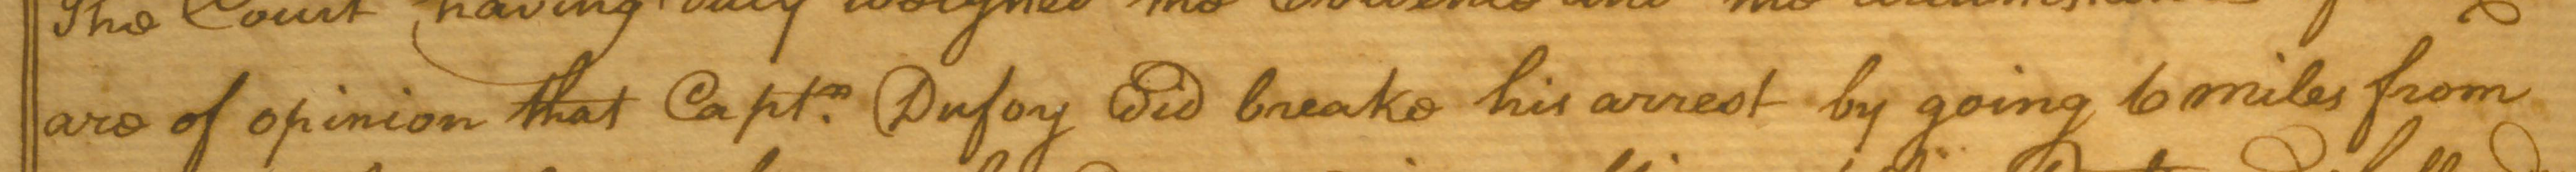are of opinion that Capt^n. Dufay did break his arrest by going 6 miles from
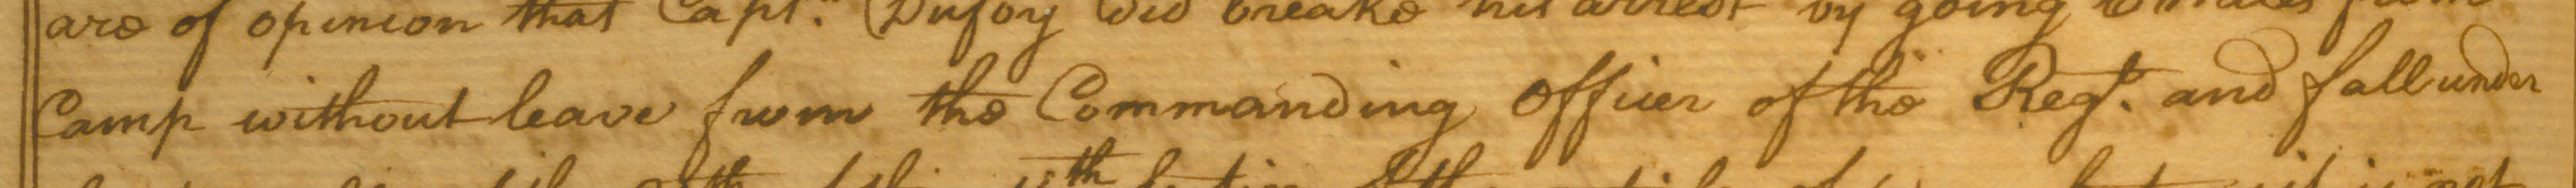Camp without leaving from the Commanding officer of the Reg^t. and fall under
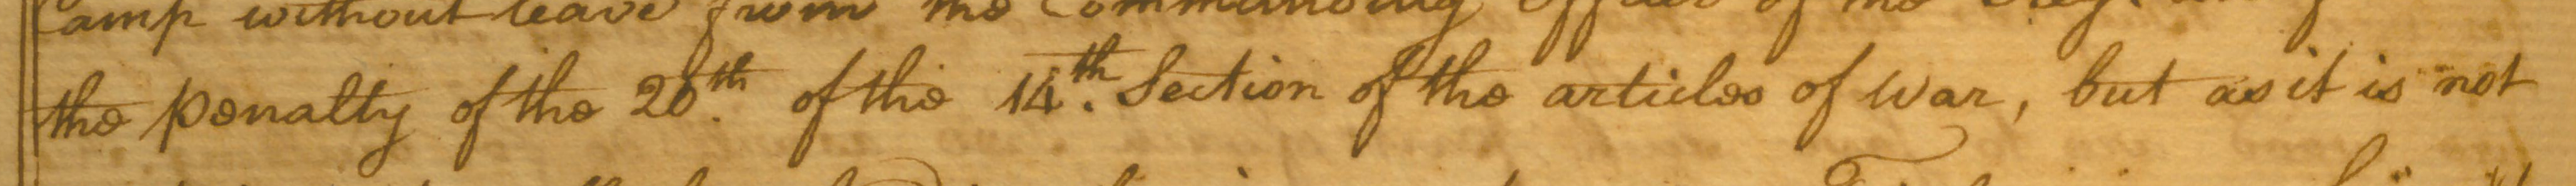the penalty of the 20^th. of the 14^th. Section of the articles of War, but as it is not
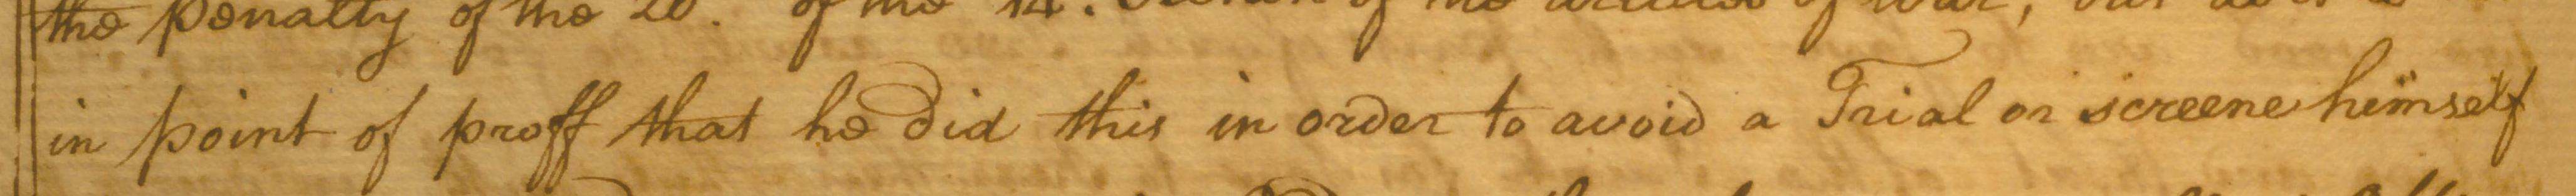in point of proff that he did this in order to avoid a Trial or screene himself
